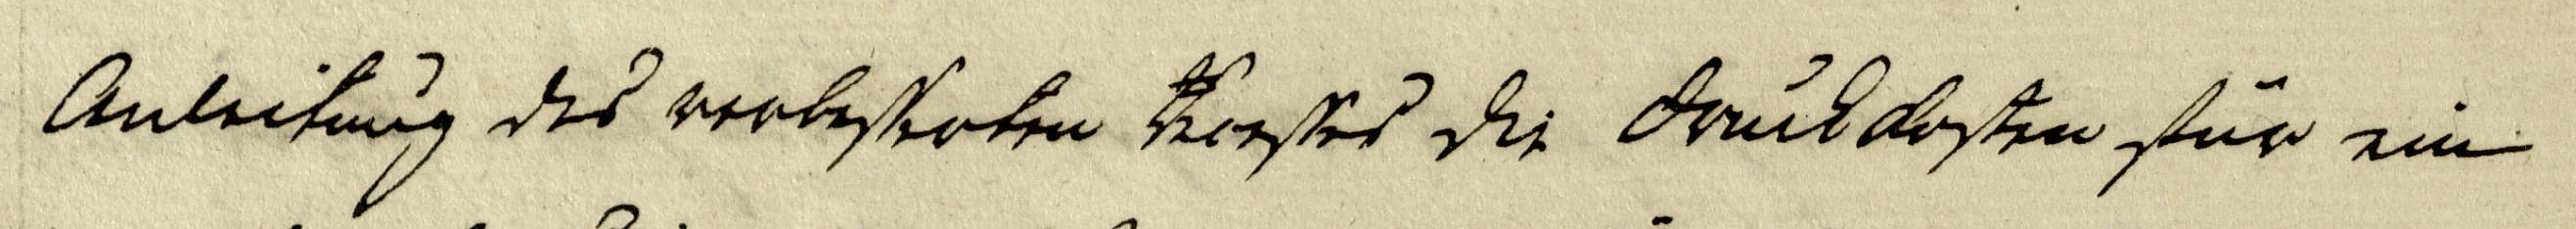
Anleitung des verbesserten Recesses die Druckkosten für ein
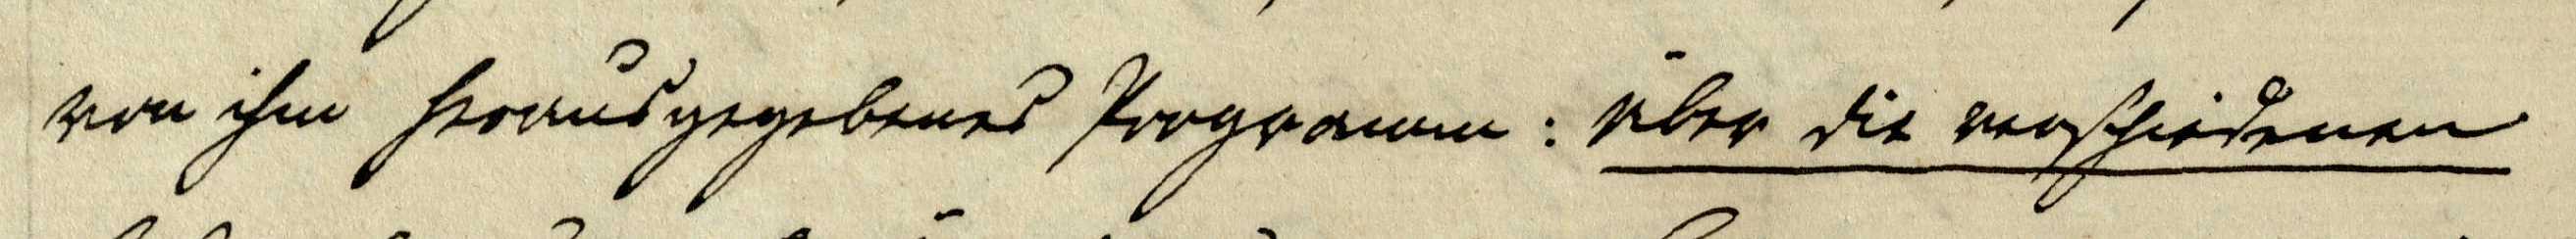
von ihm herausgegebenes Programm: über die verschiedenen
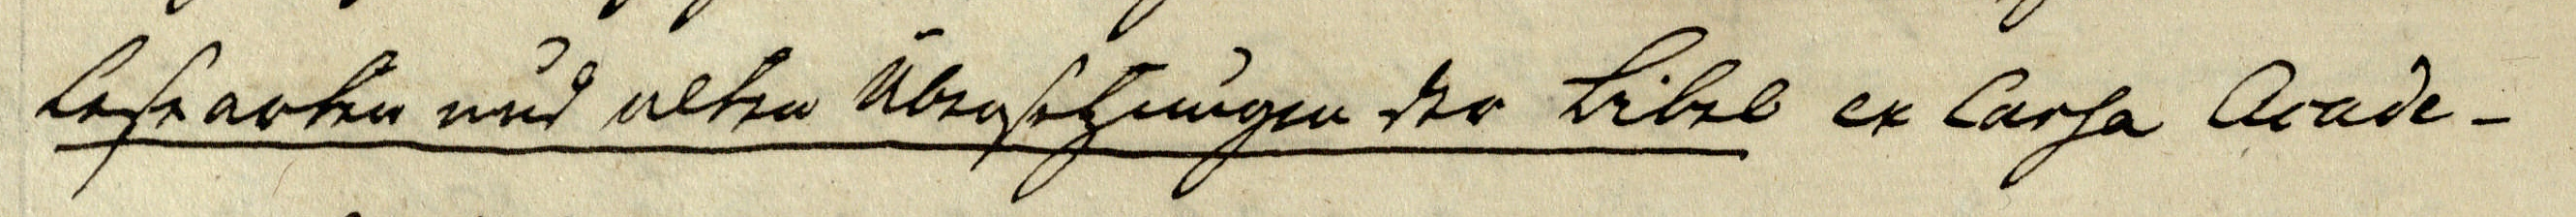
Lesearten und alten Übersetzungen der Bibel ex Cassa Acade¬
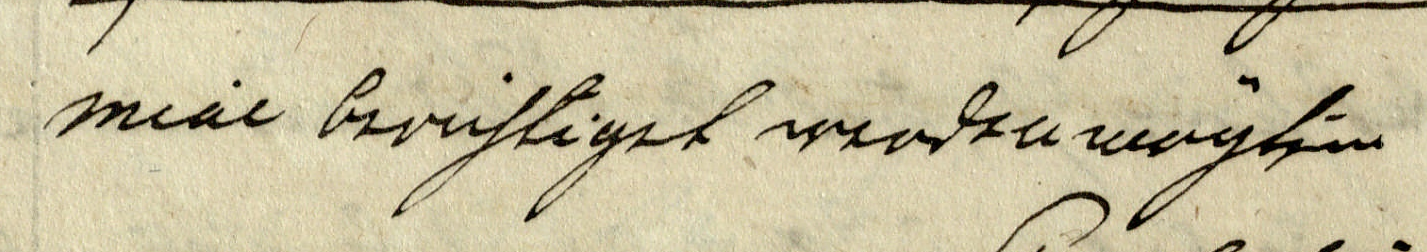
miae berichtiget werden mögten
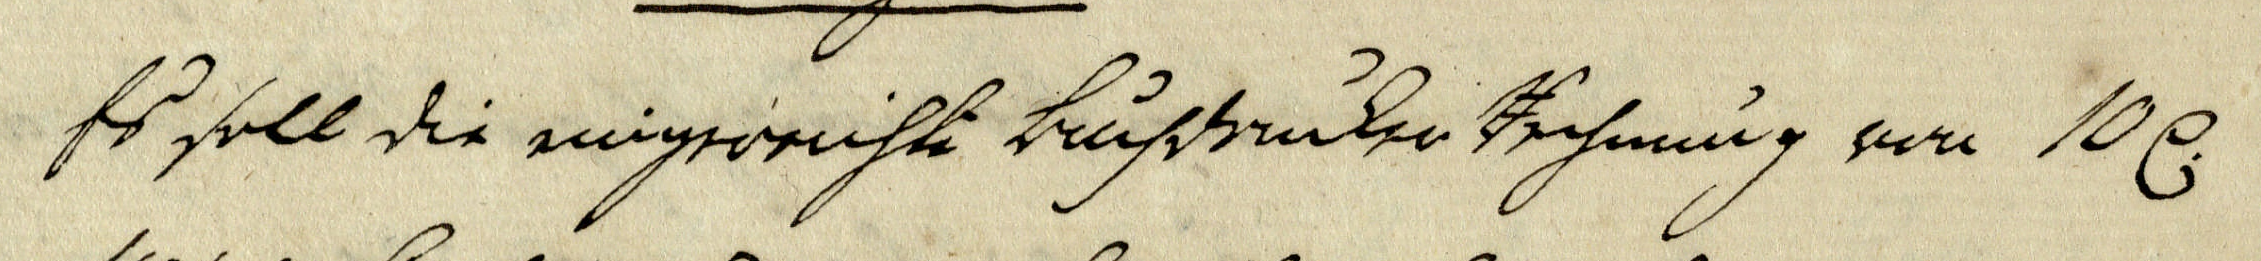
Es soll die eingereichte Buchdrucker Rechnung von 10 l.
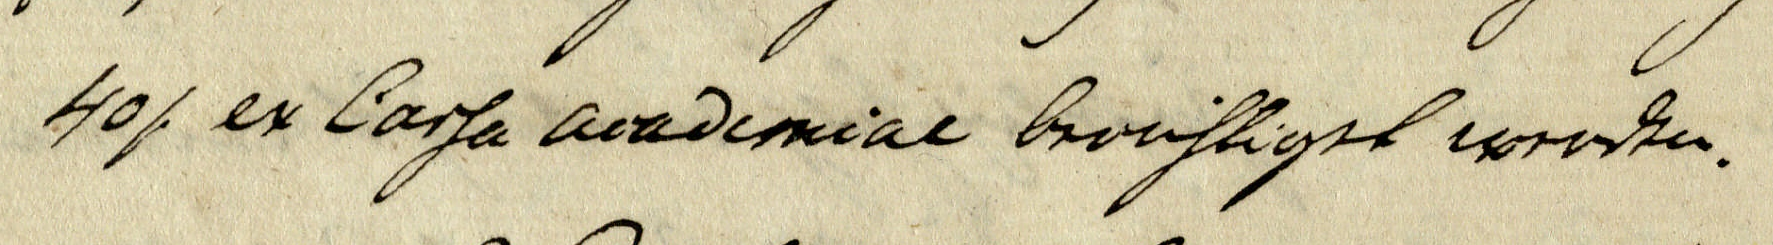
40 s. ex Cassa Academiae berichtiget werden.
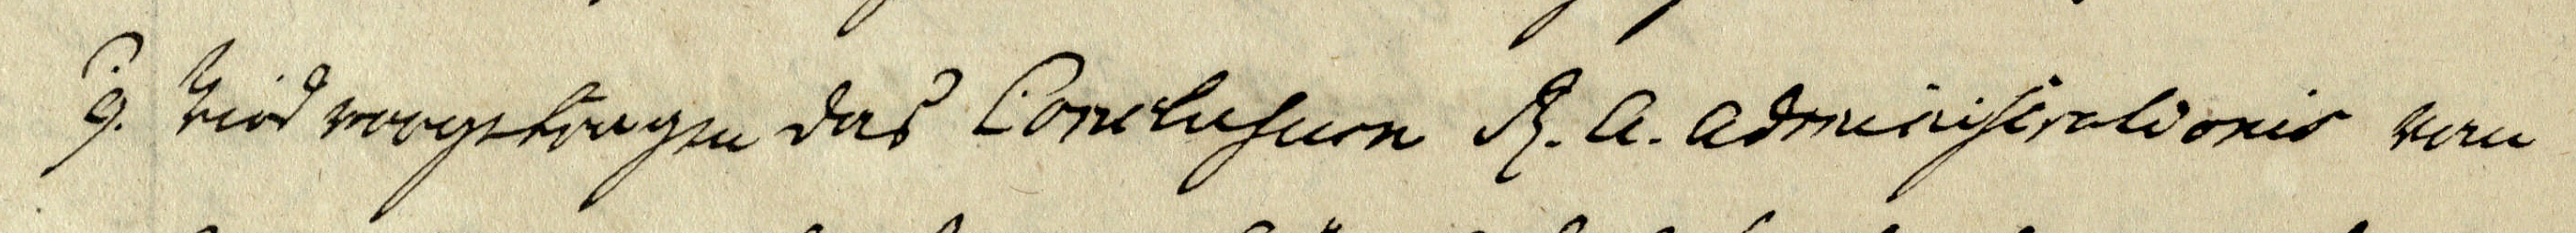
9. Wird vorgetragen das Conclusum K. A. Administrationis vom
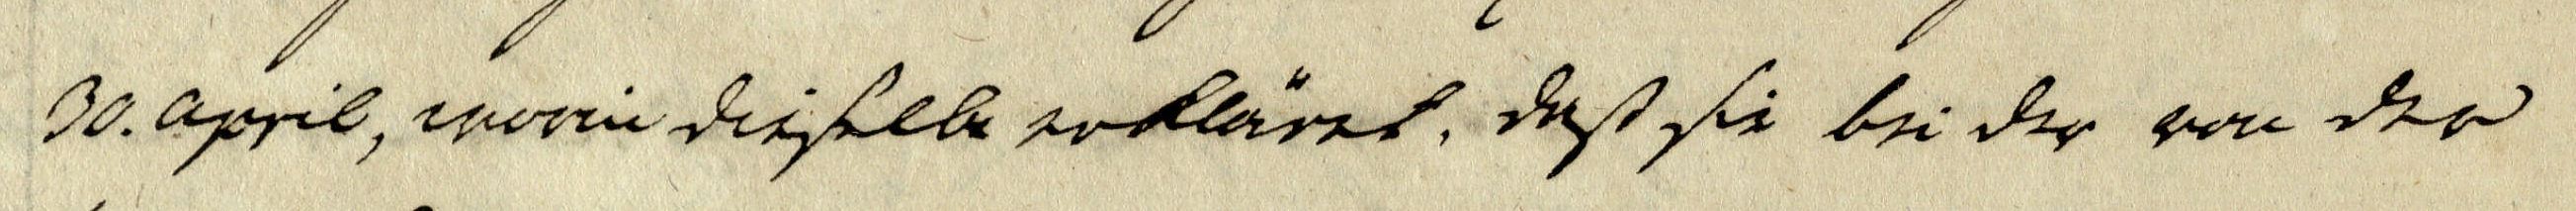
30. April, worin dieselbe erkläret, daß sie bei der von der
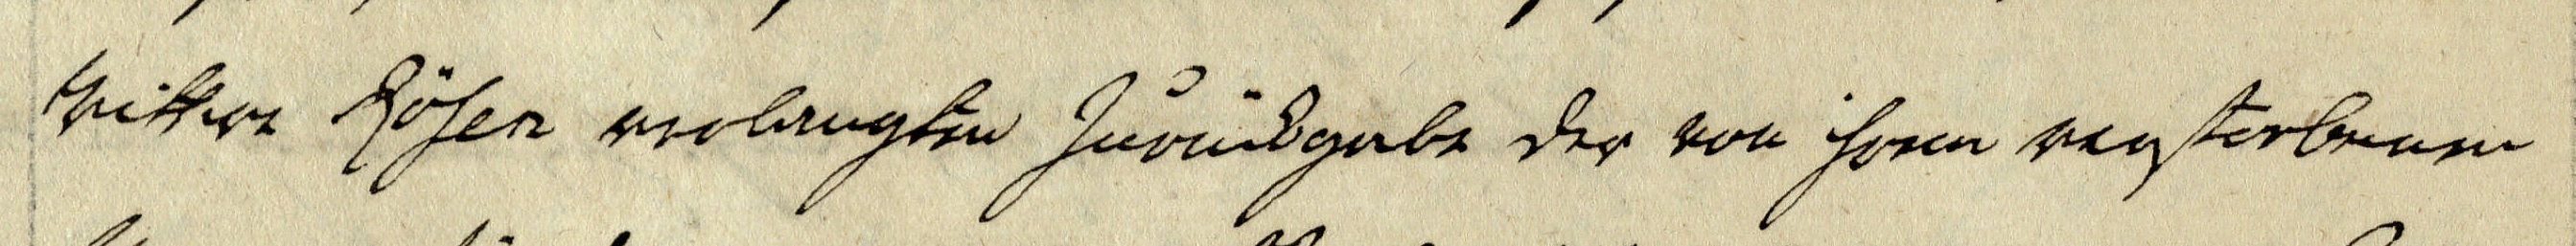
Wittwe Rösen verlangten Zurückgabe der von ihrem verstorbenen
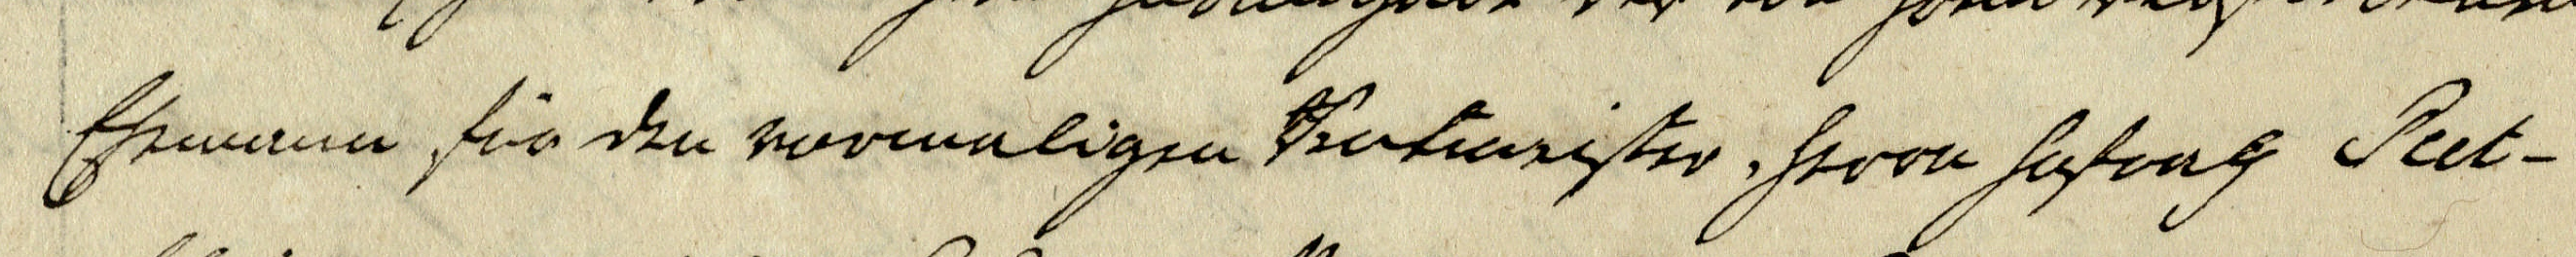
Eheman für den vormaligen Rentmeister, Herrn Hofrath Peet¬
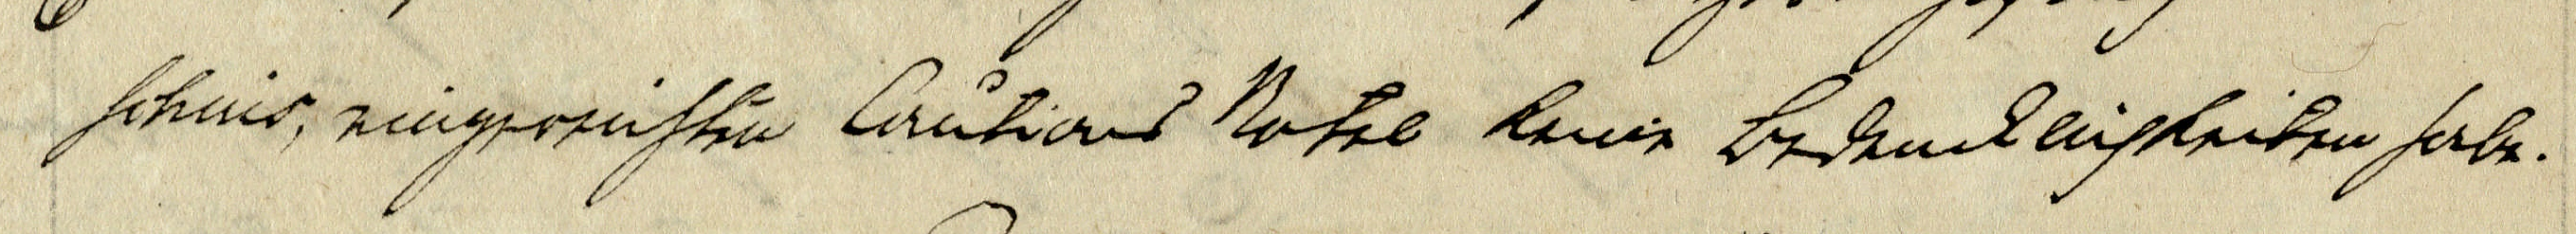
schius, eingereichten Cautions Notel keine Bedencklichkeiten habe.
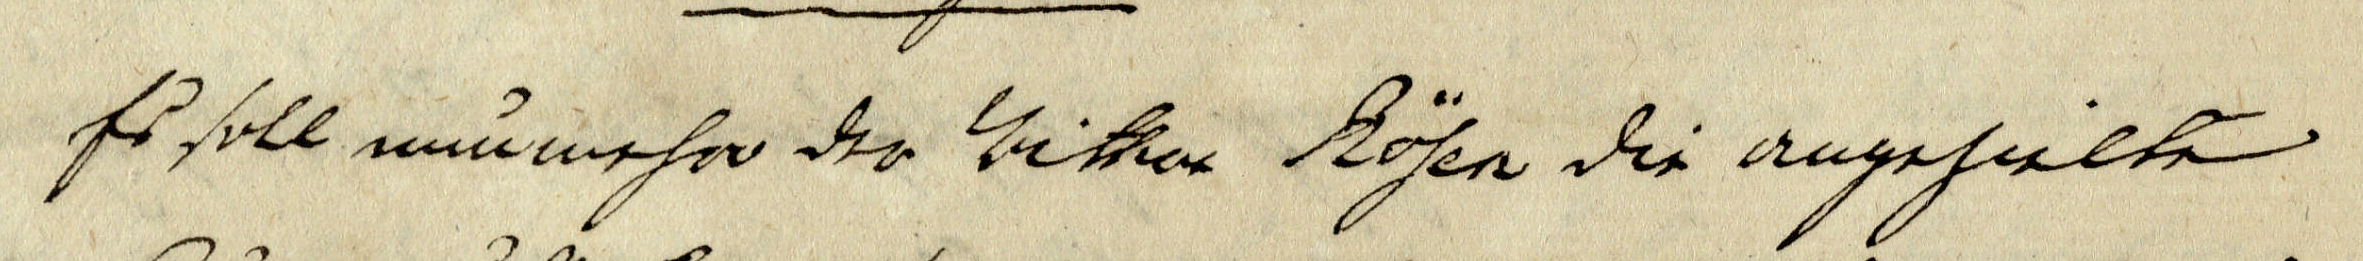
Es soll nunmehro der Wittwen Rösen die angezielte
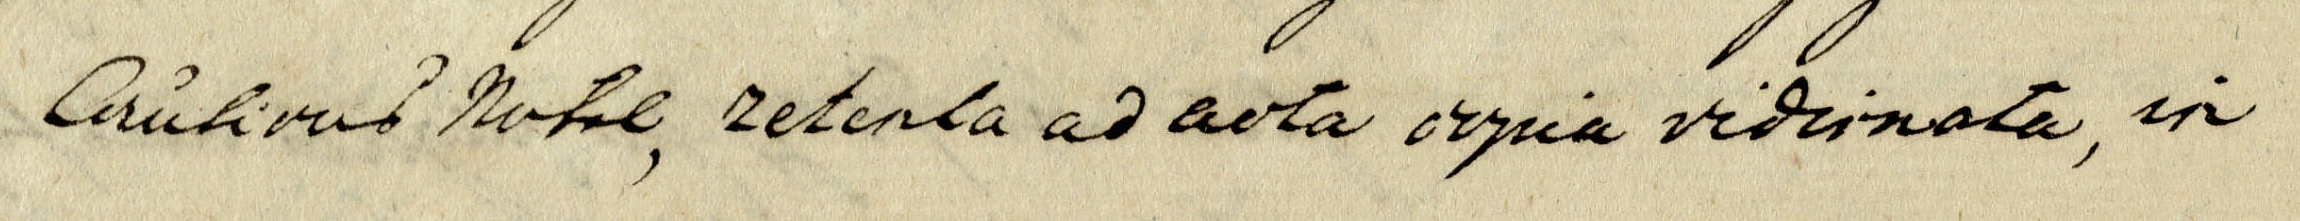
Cautions Notel, retenta ad acta copia vidimata, in
